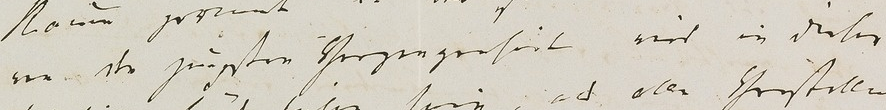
von der jüngsten Vergangenheit wird in dieser
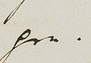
gen.
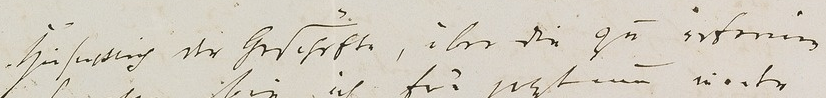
Hinsichtlich der Geschäfte, über die zu referiren
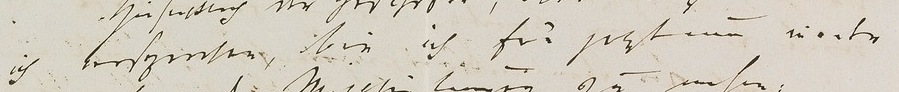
ich versprochen, bin ich für jetzt nur in der
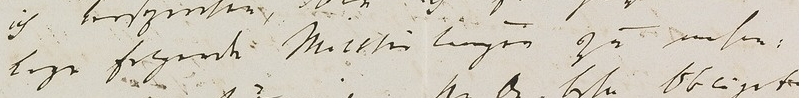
Lage folgende Mittheilungen zu machen:
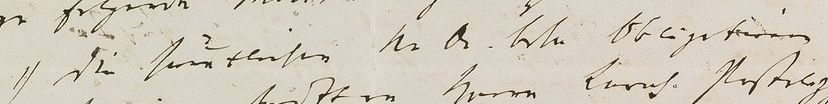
1) Die sämmtlichen N.O.bahn Obligationen
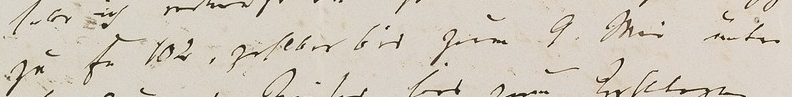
zu Fr 102, zahlbar bis zum 9. Mai unter
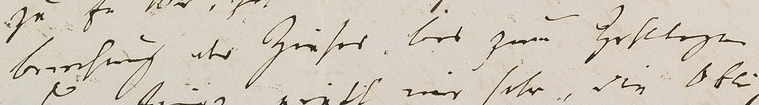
Berechnung des Zinses, bis zum Zahltage.
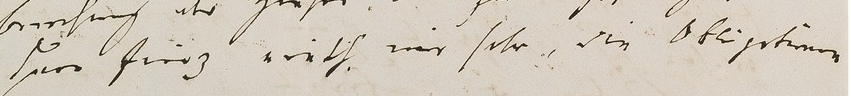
Herr Fierz rieth mir sehr, die Obligationen
